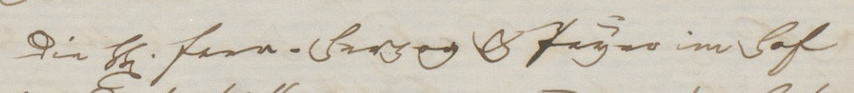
Die HH. Fehr-Herzog & Peyer im Hof
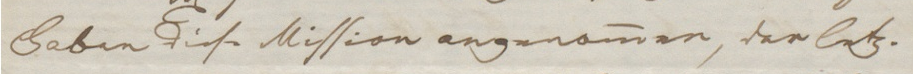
haben diese Mission angenommen, der letz-
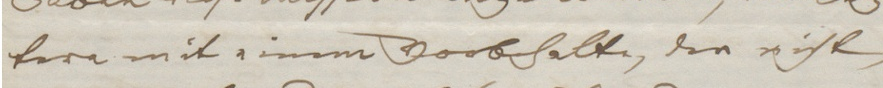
tere mit einem Vorbehalte, der nicht
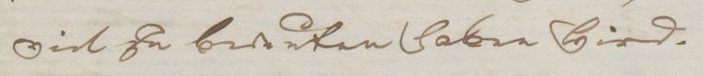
viel zu bedeuten haben wird.
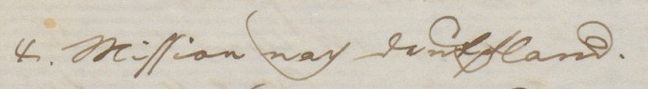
4. Mission nach Deutschland.
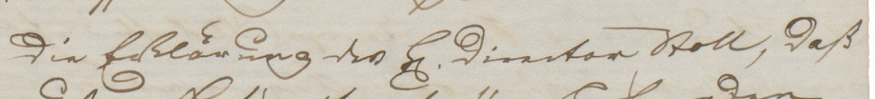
Die Erklärung des H. Director Stoll, daß
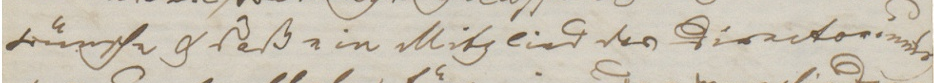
wünsche & daß ein Mitglied des Directoriums
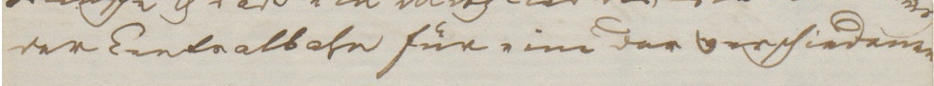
der Centralbahn für eine der verschiedenen
